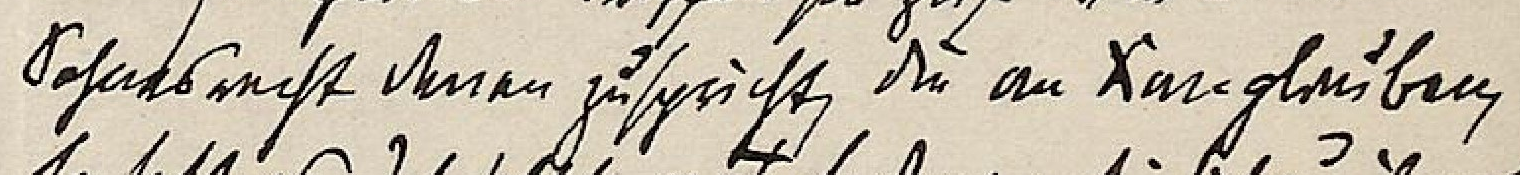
Sohnesrecht denen zuspricht, die an Χm glauben,
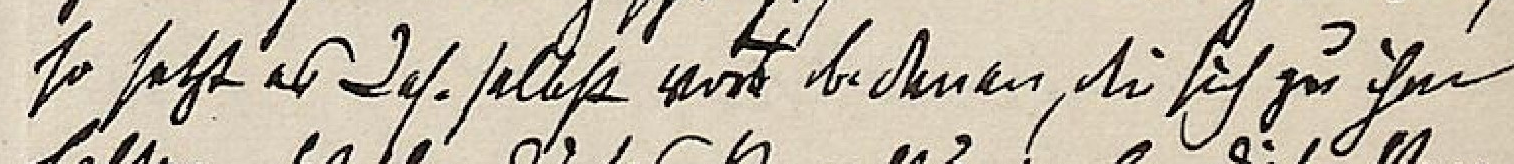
so setzt es Jes. selbst vor b. denen, die sich zu ihm
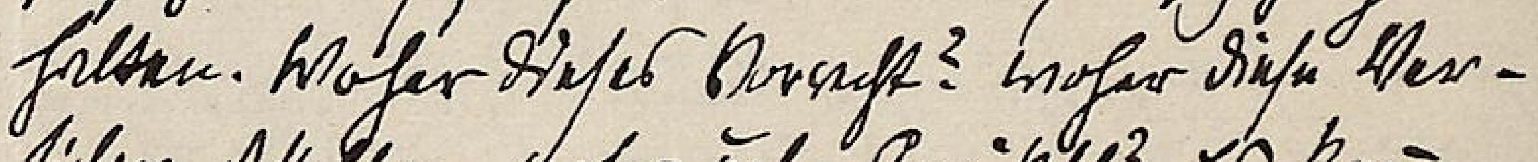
halten. Woher dieses Vorrecht? woher diese Ver¬
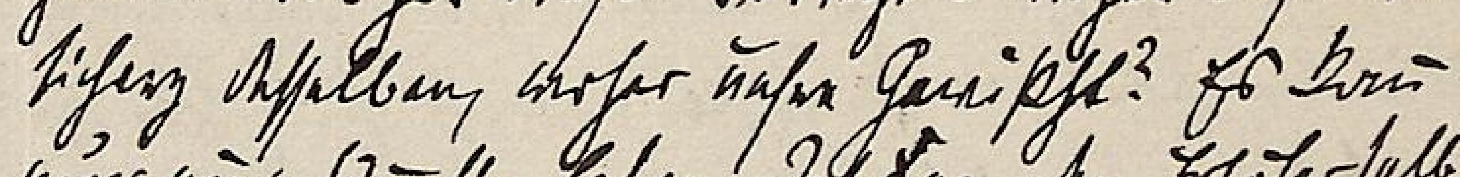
sicherg gesselben, woher unsre Gewißht? Es kan
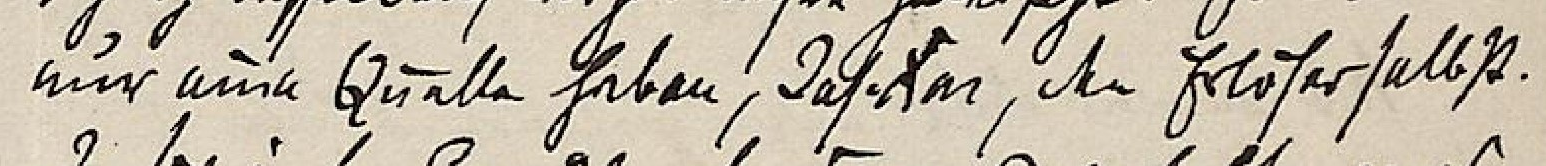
nur eine Quelle haben, Jes Χm, den Erlöser selbst.
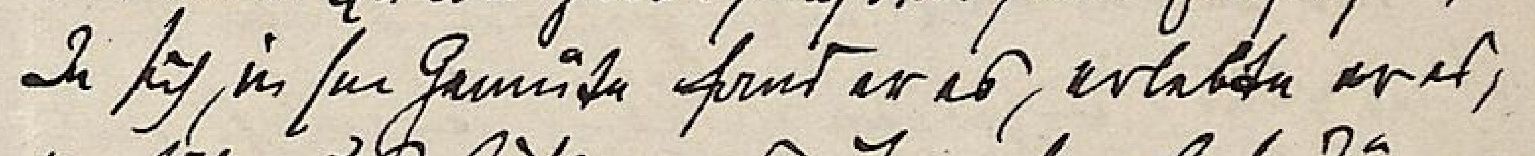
In sich, in sm Gemüte fand er es, erlebte er es,
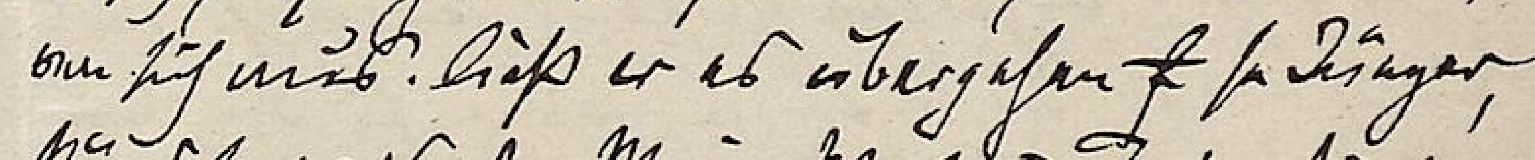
von sich aus. Ließ er es übergehen f sn Jünger,
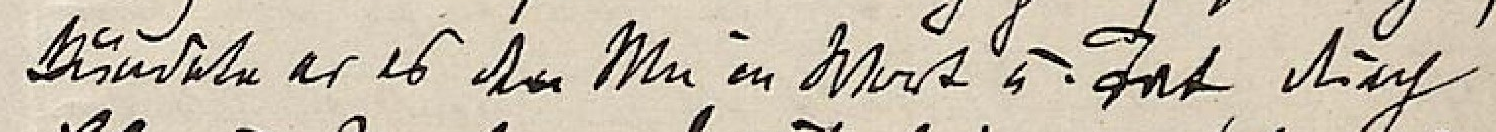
kündete er es den Mn in Wort u. Tat, durch
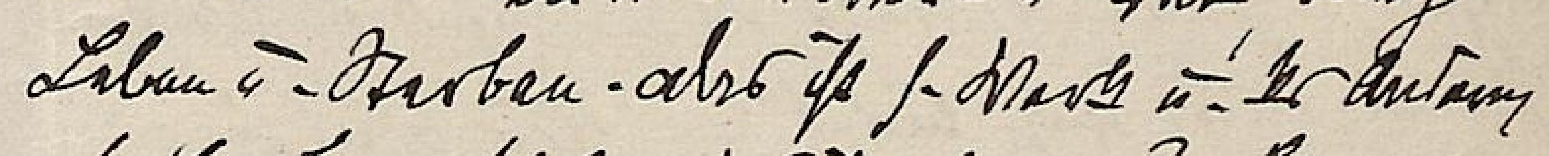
Leben u. Sterben. Das ist s Werk u. ks Anderen,
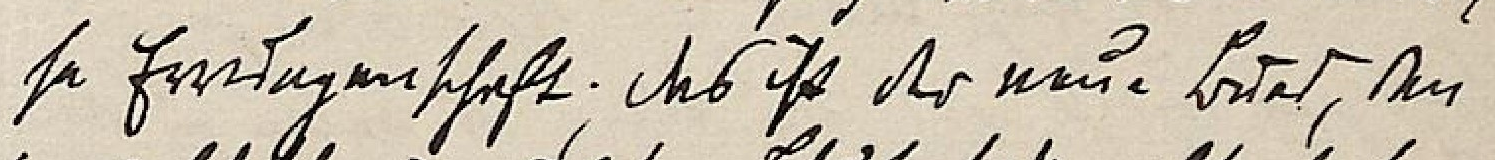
sn Errungenschaft; das ist der neue Bund, den
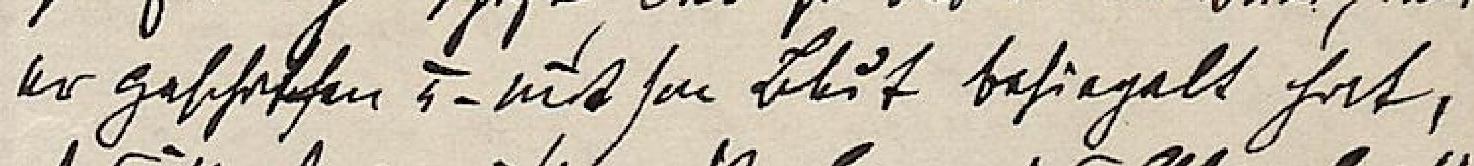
er geschaffen u. mit dem Blut besiegelt hat,
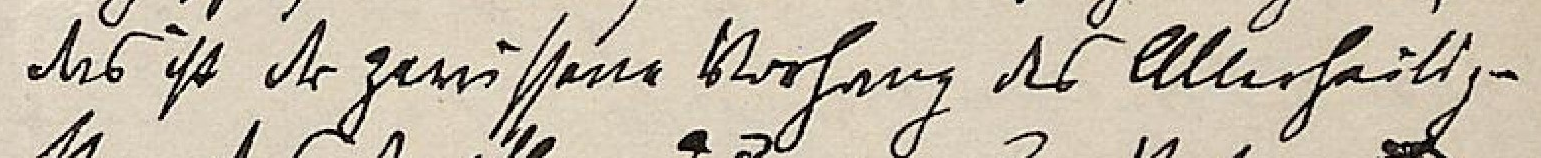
das ist der zerrissene Vorhang des Allerheilig¬
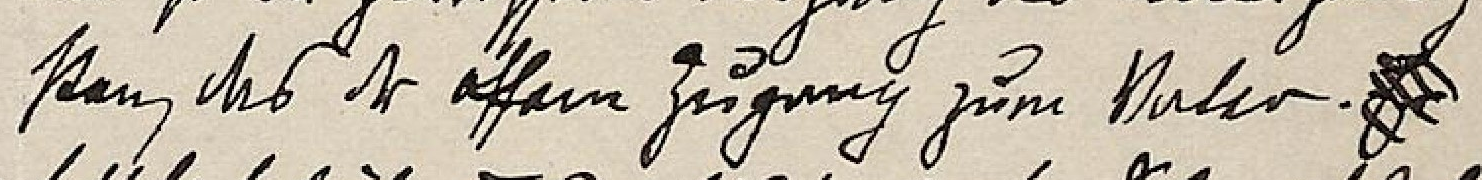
sten, das der offene Zugang zum Vater. Er
